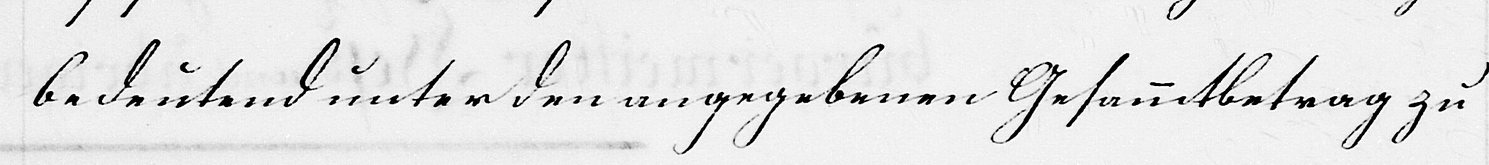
bedeutend unter den angegebenen Gesammtbetrag zu
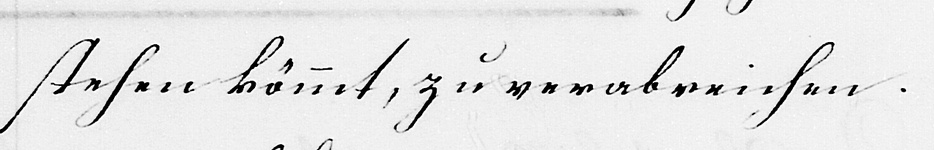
stehen kömmt, zu verabreichen.
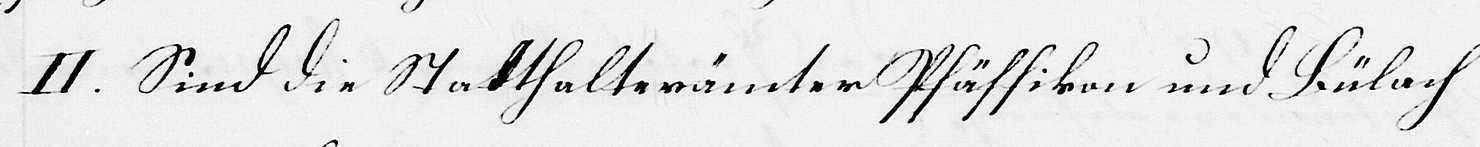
II. Sind die Stadthalterämter Pfäffikon und Bülach
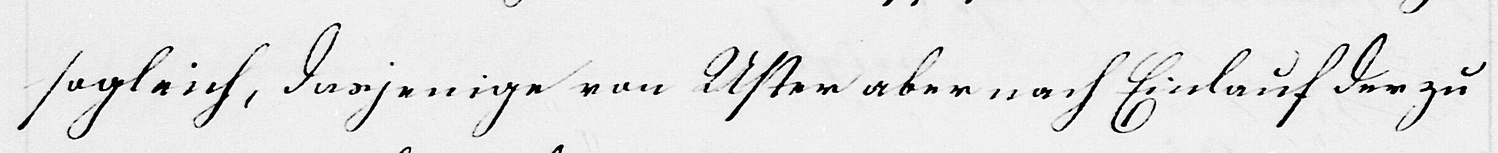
sogleich, dasjenige von Uster aber nach Einlauf der zu
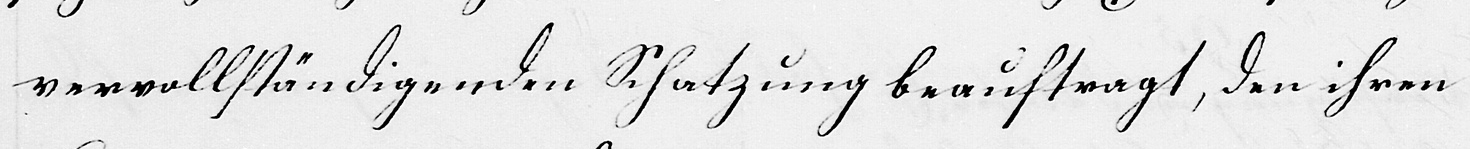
vervollständigenden Schatzung beauftragt, den ihren
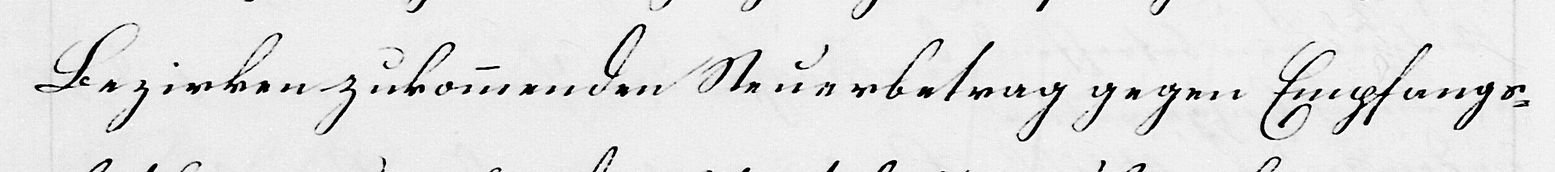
Bezirken zukommenden Steuerbetrag gegen Empfangs¬
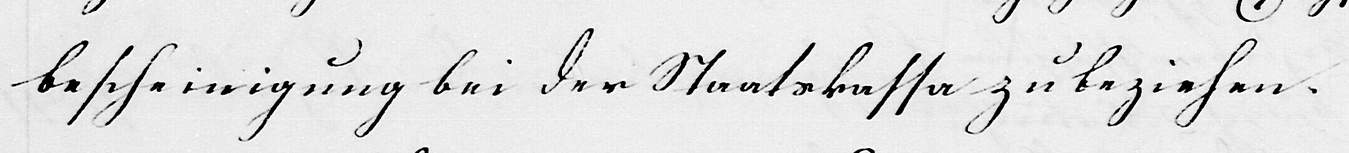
bescheinigung bei der Staatskassa zu beziehen.
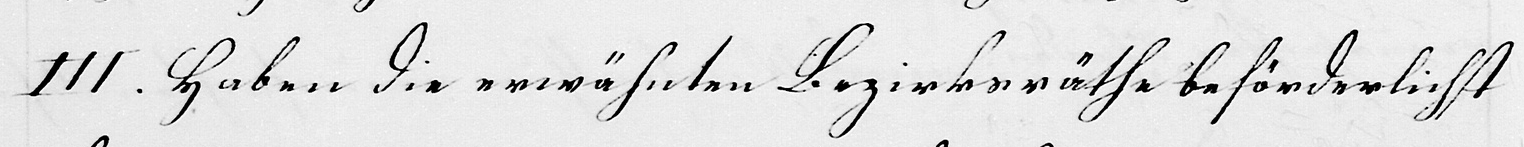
III. Haben die erwähnten Bezirksräthe beförderlichst
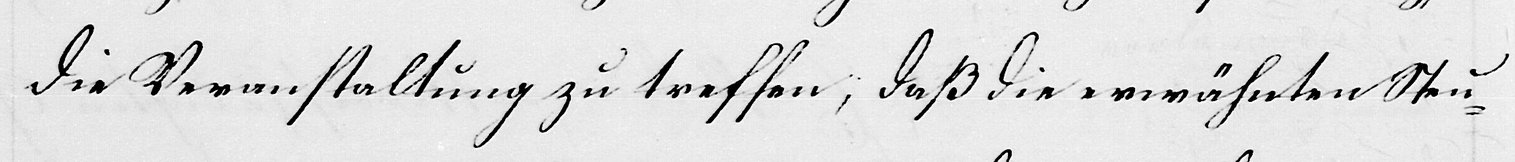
die Veranstaltung zu treffen, daß die erwähnten Steu¬
